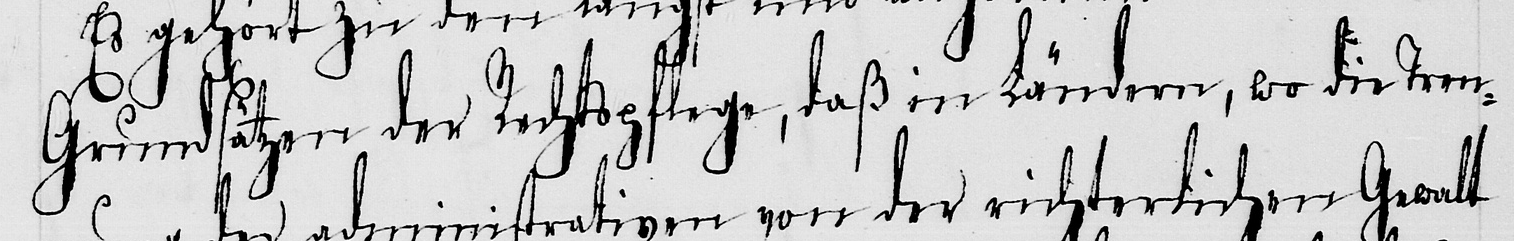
Grundsätzen der Rechtspflege, daß in Ländern, wo die Tren¬
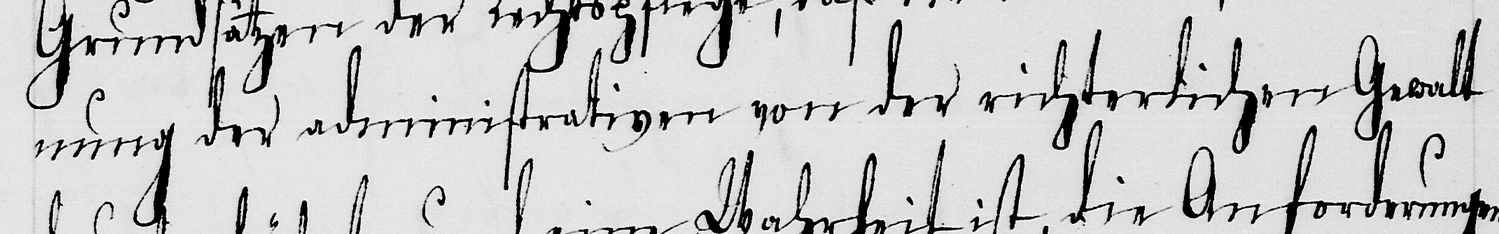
nung der administrativen von der richterlichen Gewalt
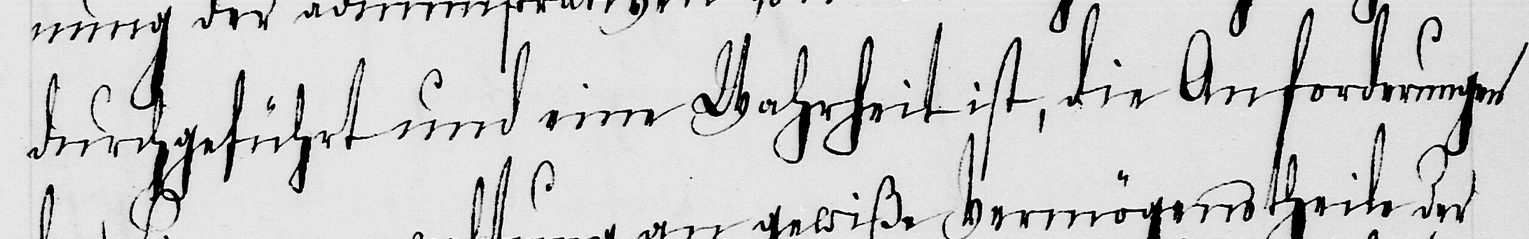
durchgeführt und eine Wahrheit ist, die Anforderungen
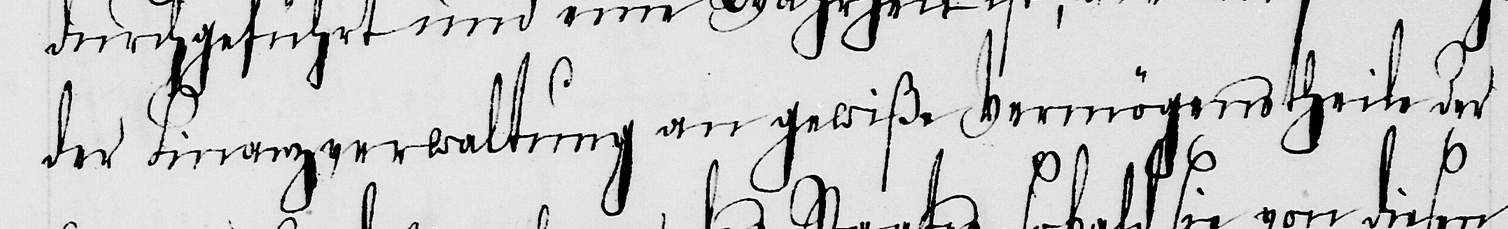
der Finanzverwaltung an gewiße Vermögenstheile der
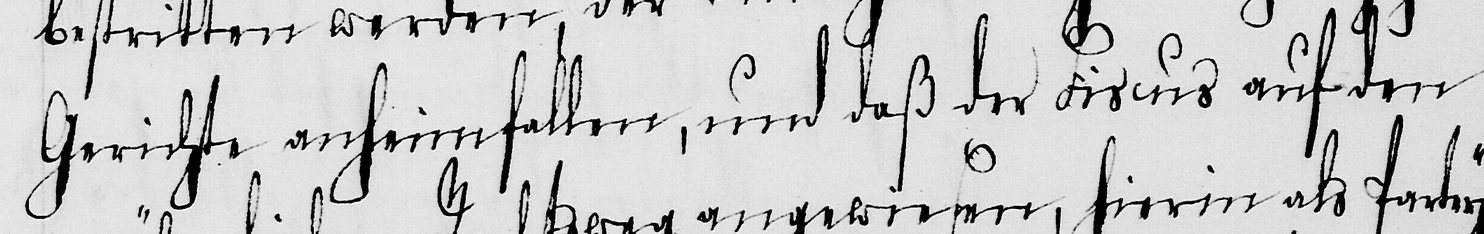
Gerichte anheimfallen, und daß der Fiscus auf den
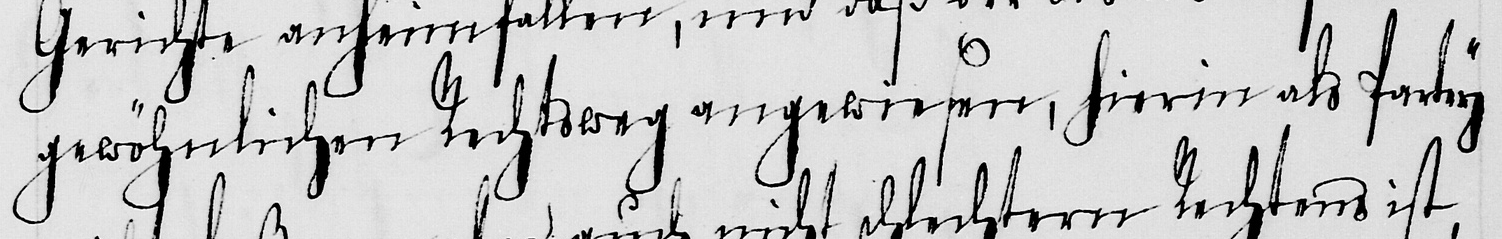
gewöhnlichen Rechtsweg angewiesen, hierin als Partey
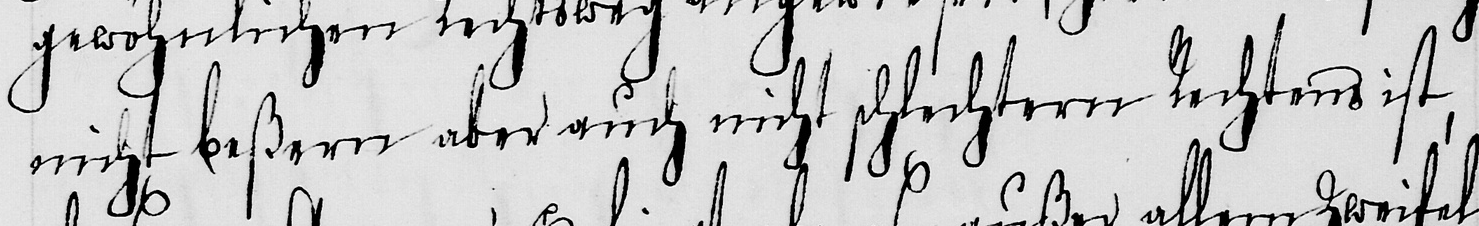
nicht beßern aber auch nicht schlechtern Rechtes ist,
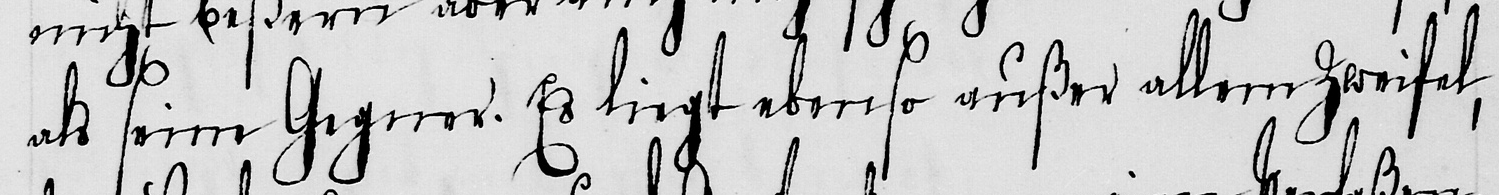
als seine Gegner. Es liegt ebenso außer allem Zweifel,
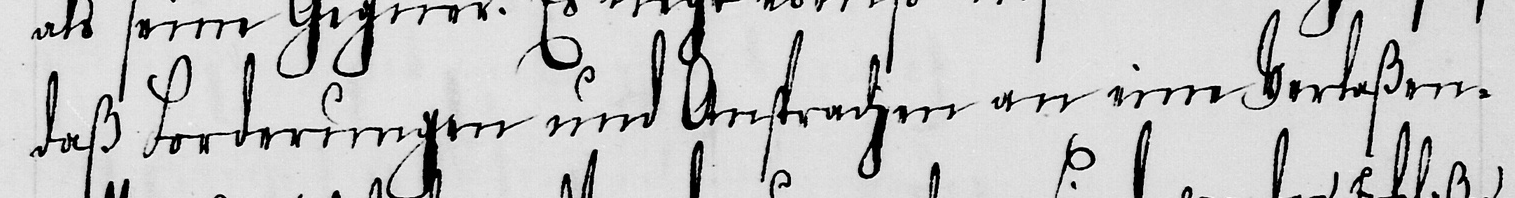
daß Forderungen und Ansprachen an eine Verlaßens¬
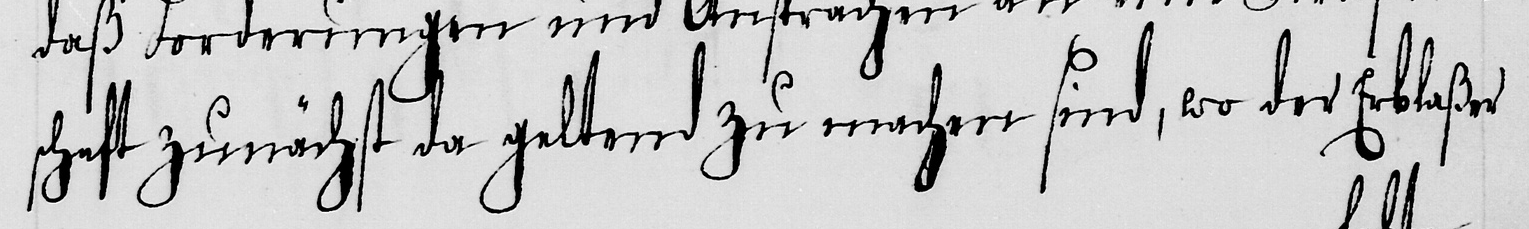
chaft zunächst da geltend zu machen sind, wo der Erblaßer
